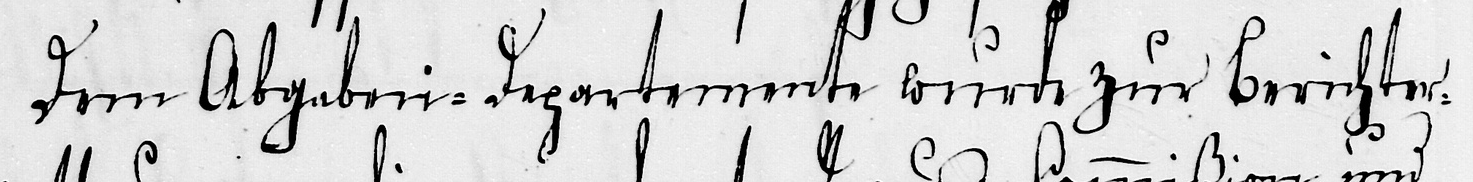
Dem Abgaben-Departemente wurde zur Berichter¬
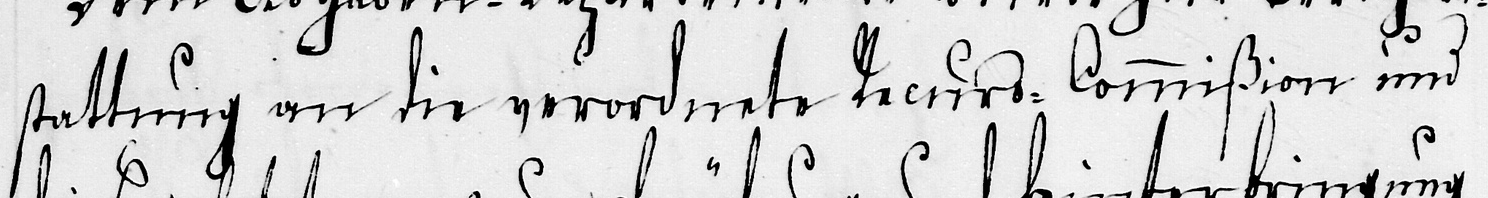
stattung an die verordnete Recurs-Commißion und
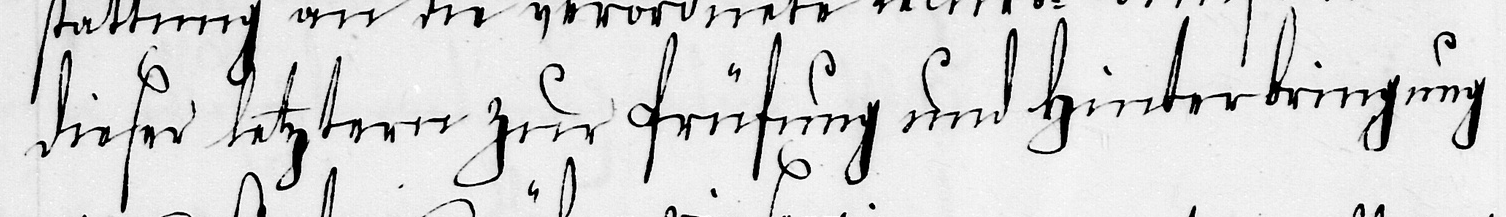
dieser letztern zur Prüfung und Hinterbringung
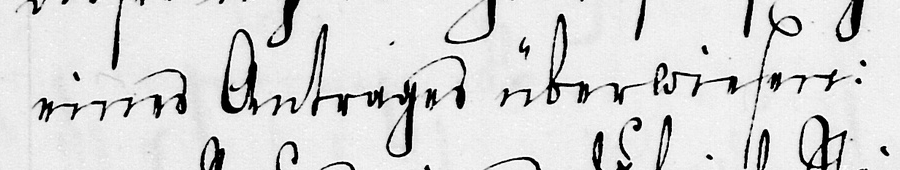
eines Antrages überwiesen:
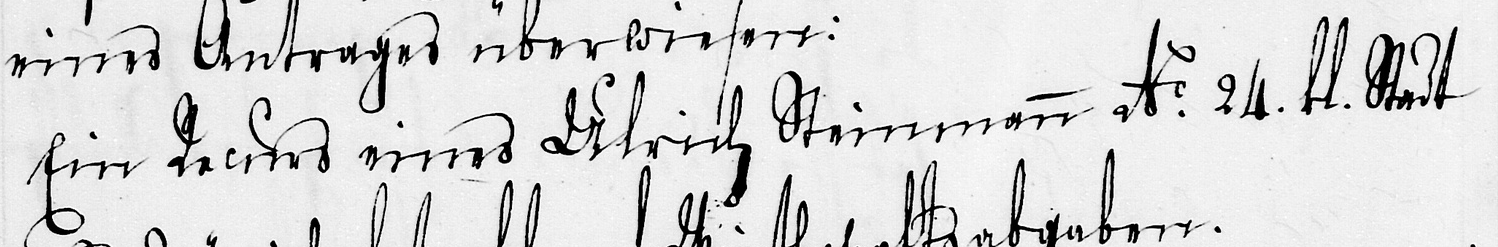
Ein Recurs eines Ulrich Steinmann No. 24. kl. Stadt
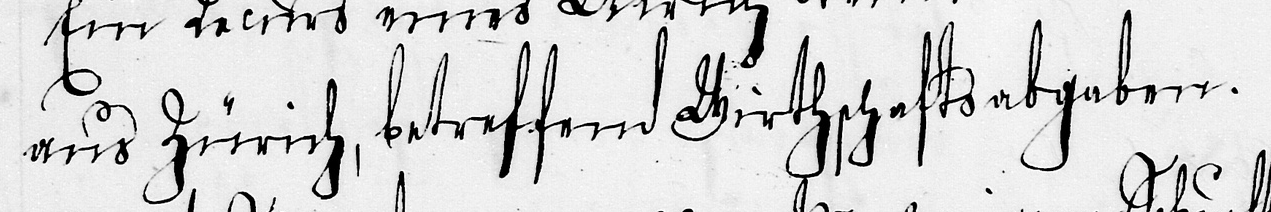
aus Zürich, betreffend Wirthschaftsabgaben.
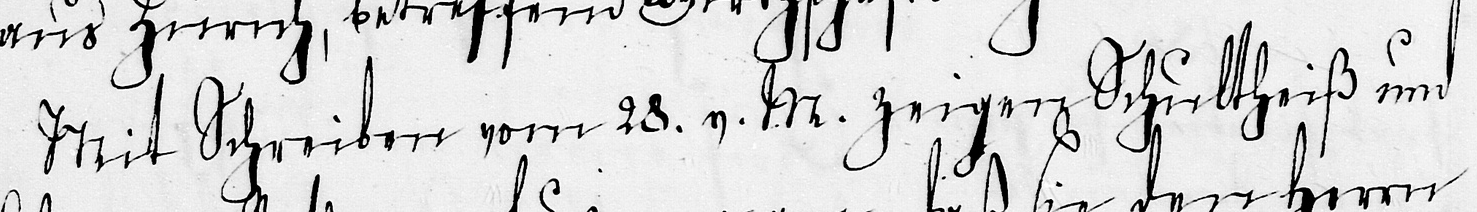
Mit Schreiben vom 28. v. M. zeigen Schultheiß und
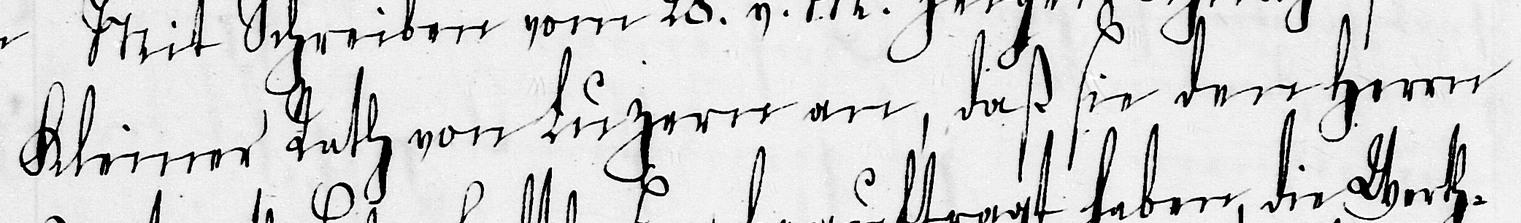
Kleiner Rath von Luzern an, daß sie den Herrn
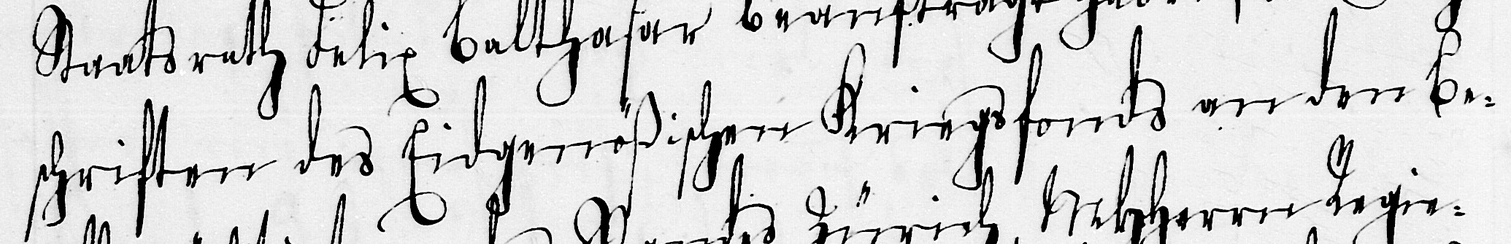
schriften des Eidgenößischen Kriegsfonds an den Be¬
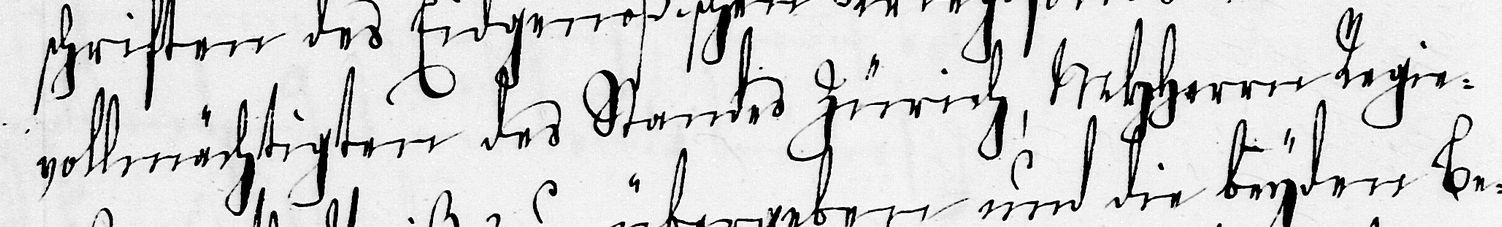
vollmächtigten des Standes Zürich, MHHerrn Regie¬
